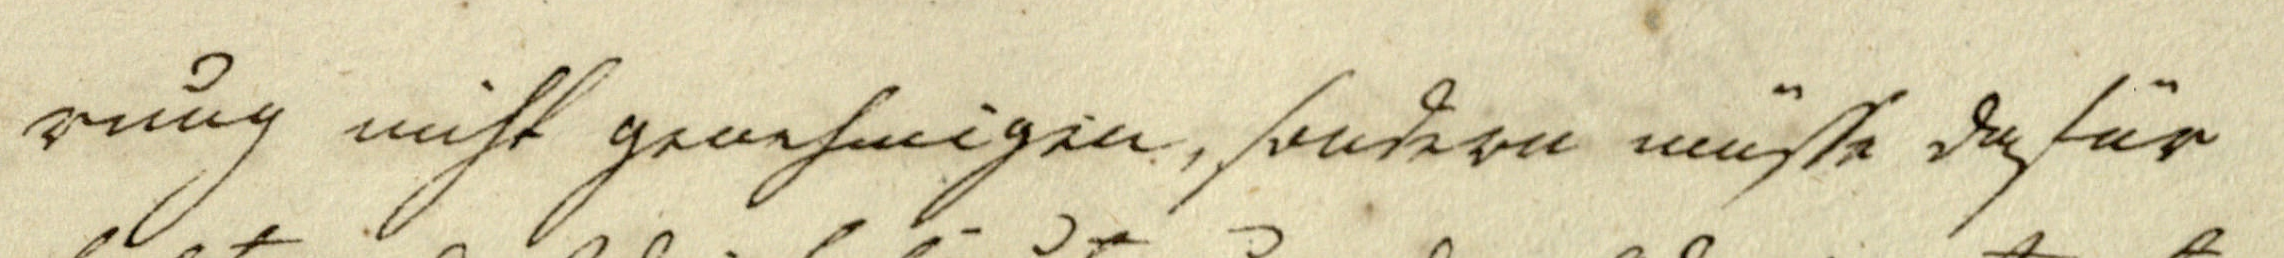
rung nicht genehmigen, sondern müsse dafür
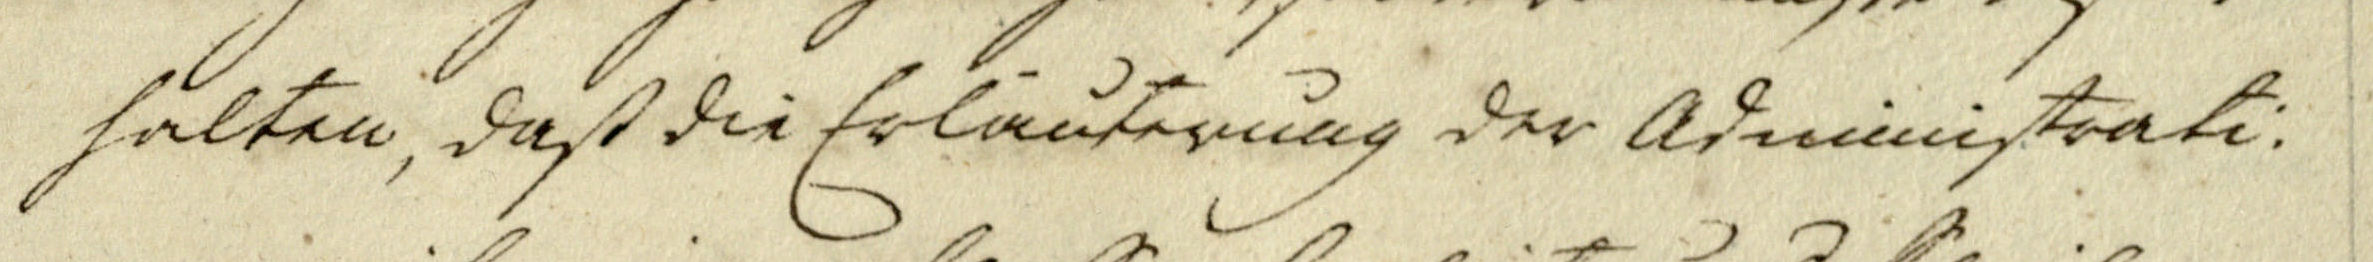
halten, daß die Erläuterung der Administrati¬
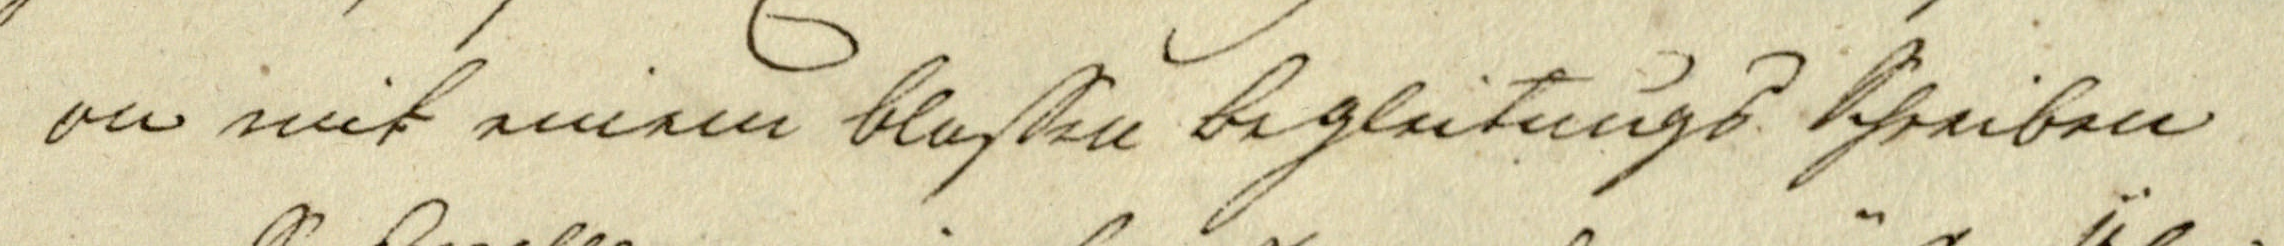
on mit einem blossen Begleitungs Schreiben
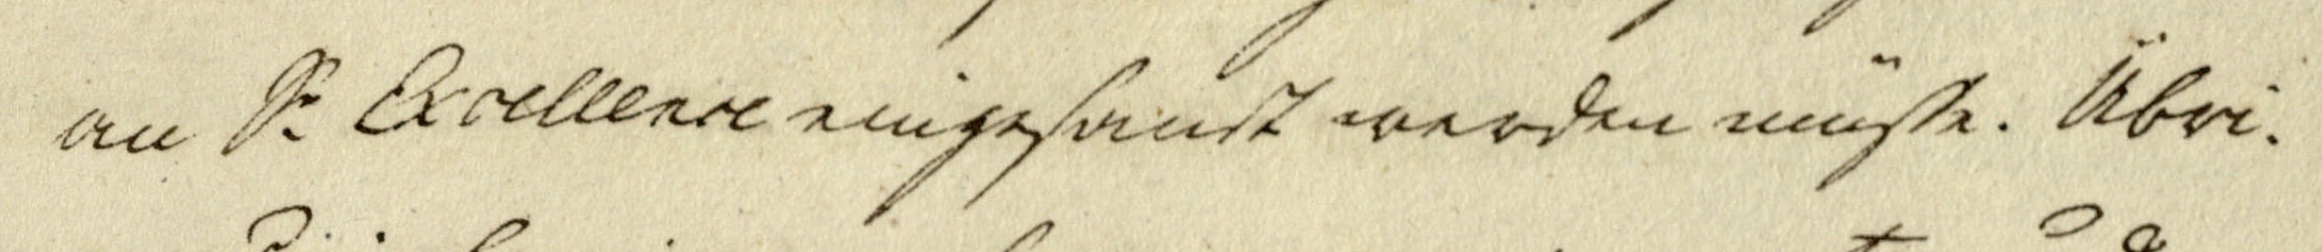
an Sr Excellence eingesandt werden müsse. Übri¬
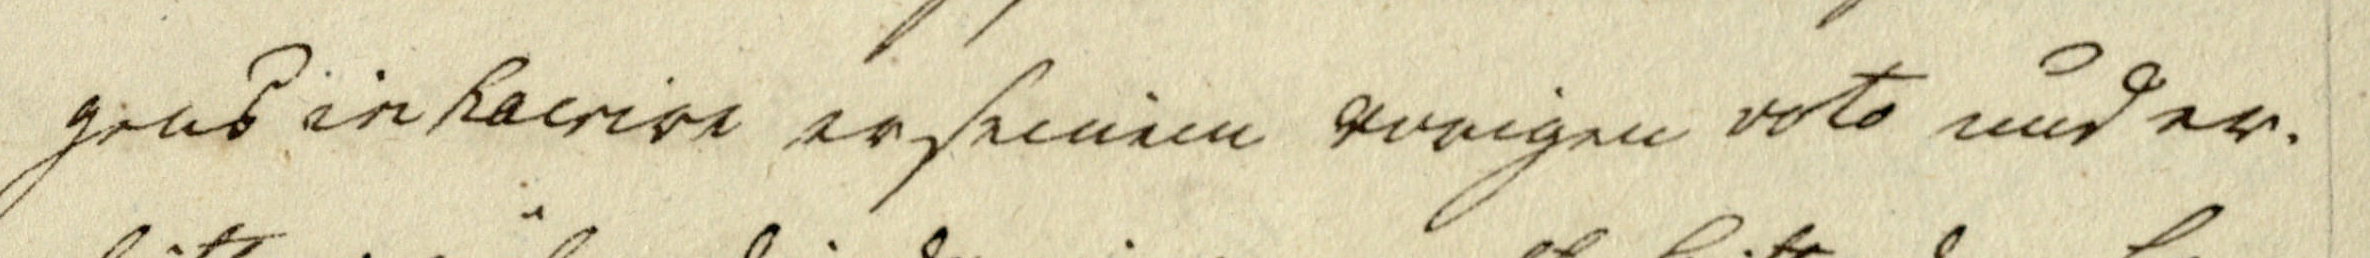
gens inhaerire er seinem vorigen voto und er¬
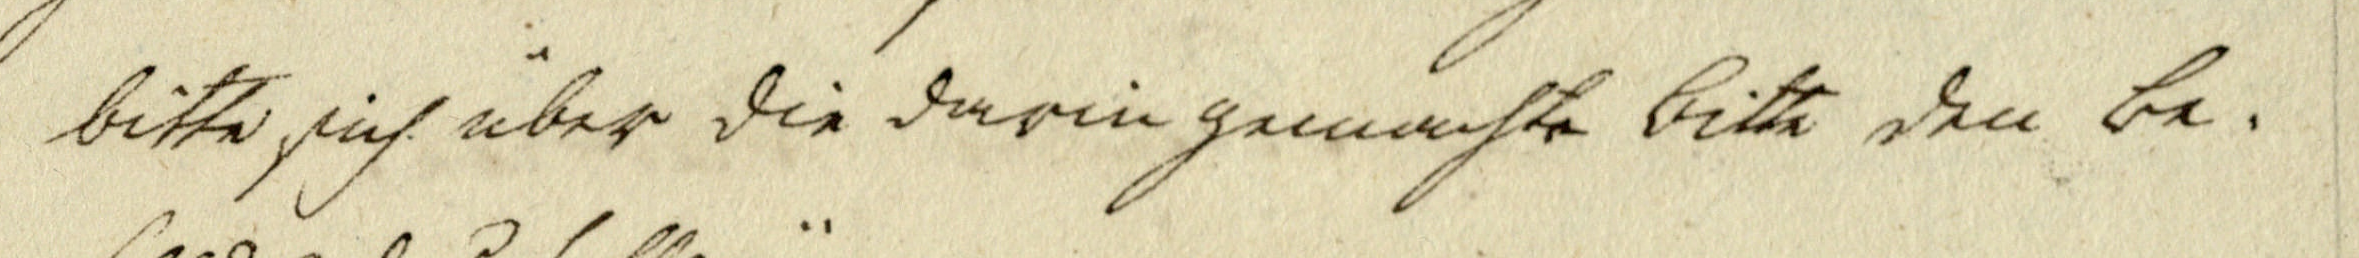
bitte sich über die darin gemachte Bitte den Be¬
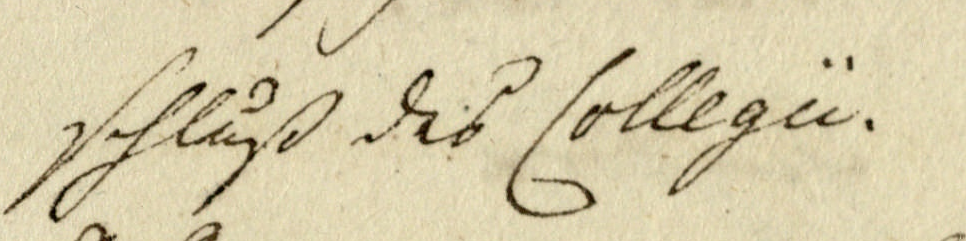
schluß des Collegii.
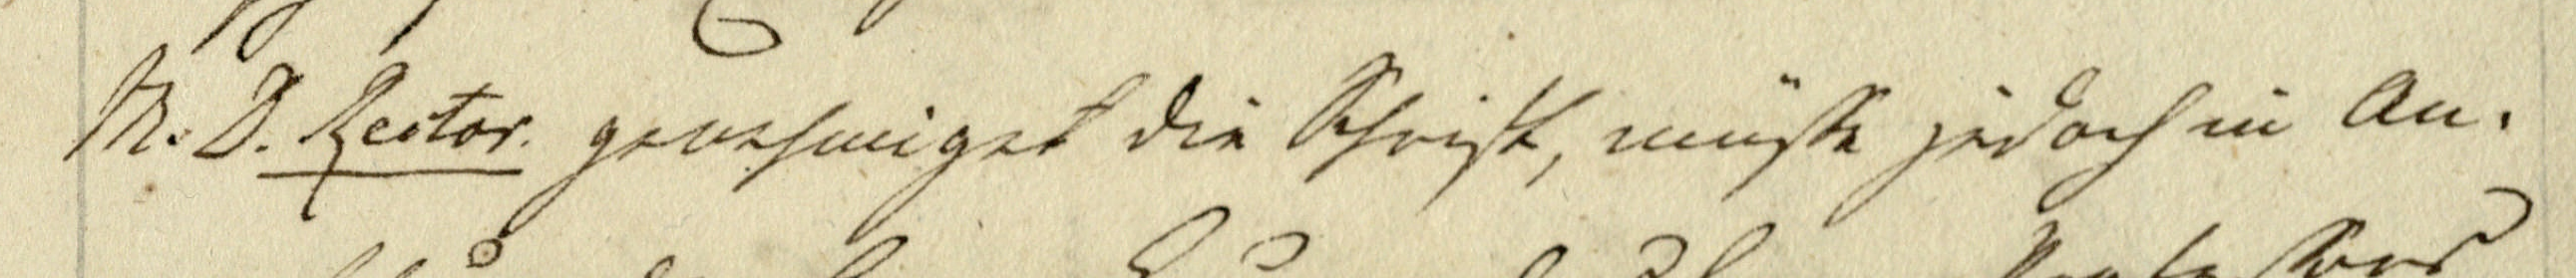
M. D. Rector genehmiget die Schrift, müsse jedoch in An¬
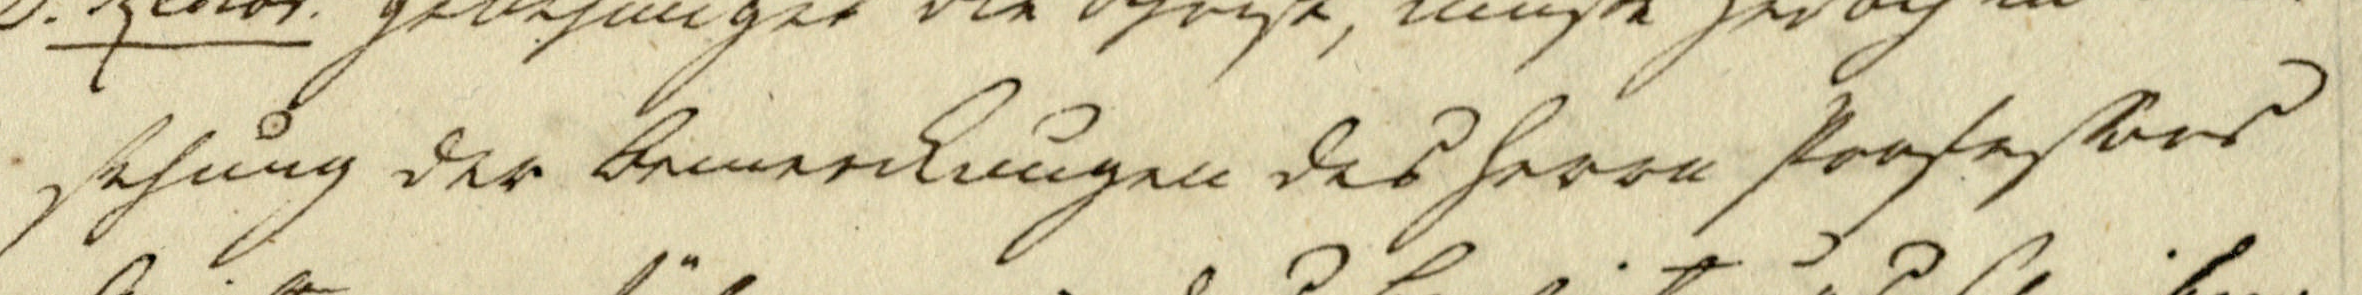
sehung der Bemerckungen des Herrn Professors
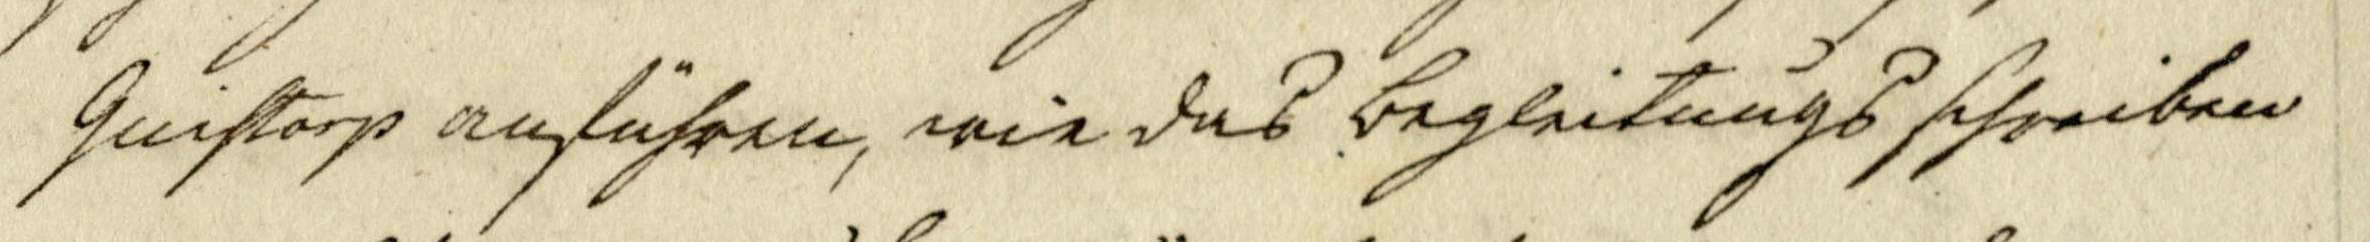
Quistorp anführen, wie das Begleitungsschreiben
